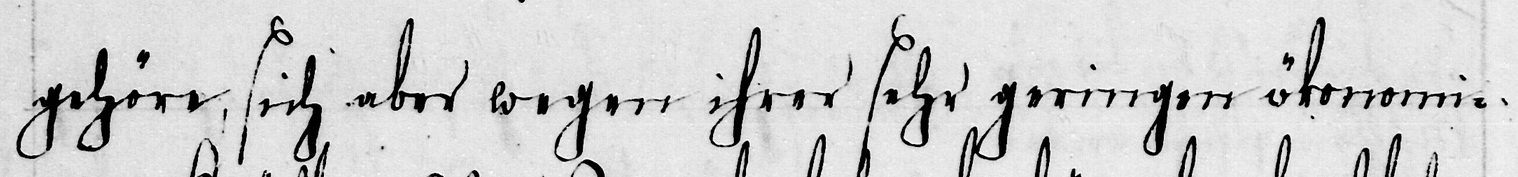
gehöre, sich aber wegen ihrer sehr geringen ökonomi¬
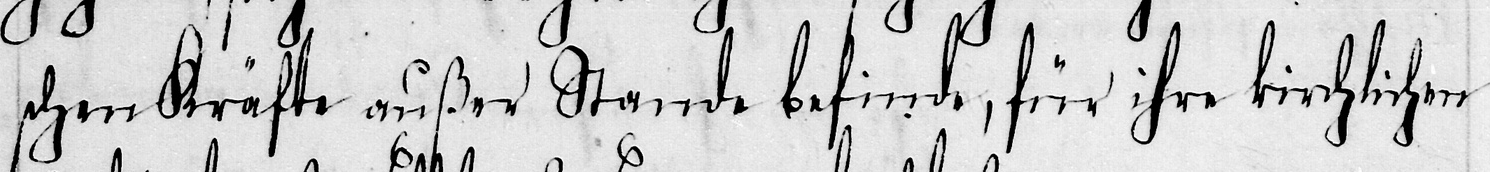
schen Kräfte außer Stande befinde, für ihre kirchlichen
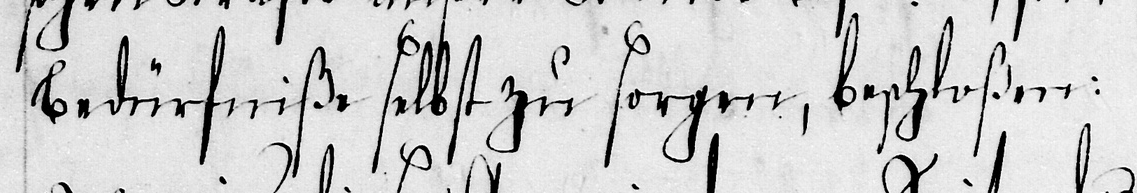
Bedürfniße selbst zu sorgen, beschloßen:
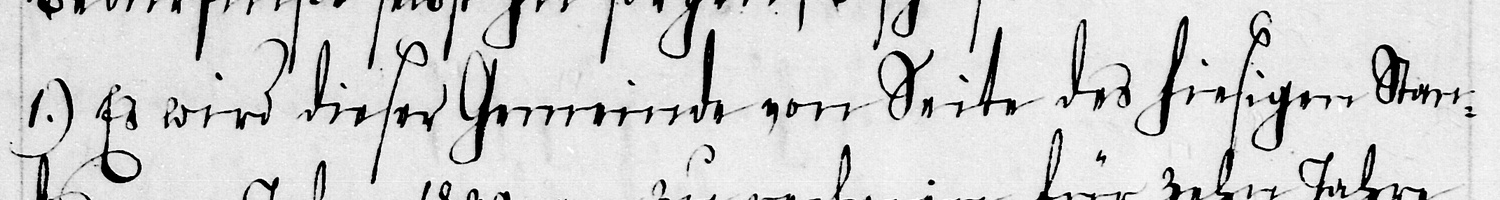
1.) Es wird dieser Gemeinde von Seite des hiesigen Stan¬
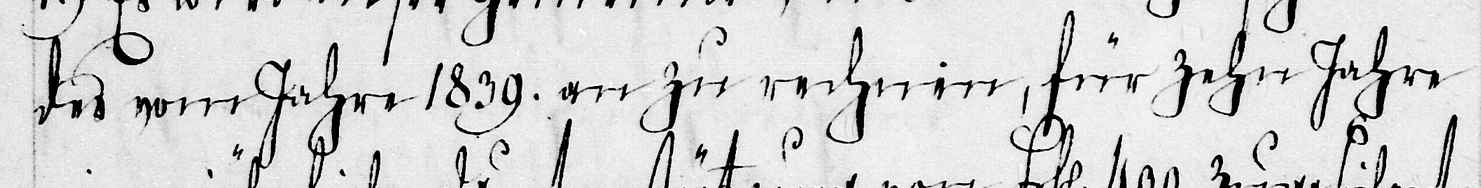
des vom Jahre 1839. an zu rechnen, für zehn Jahre
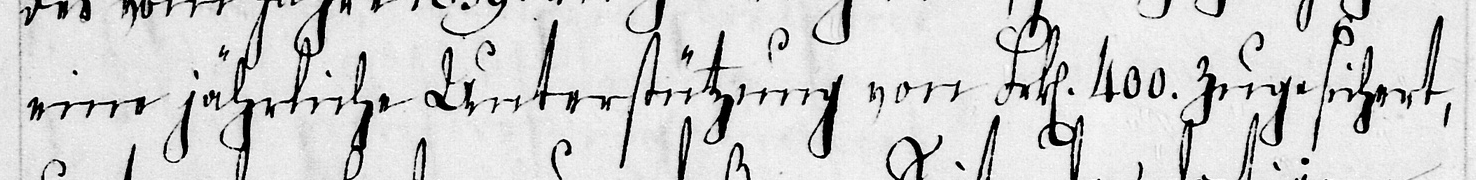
eine jährliche Unterstützung von Frk[en]. 400. zugesichert,
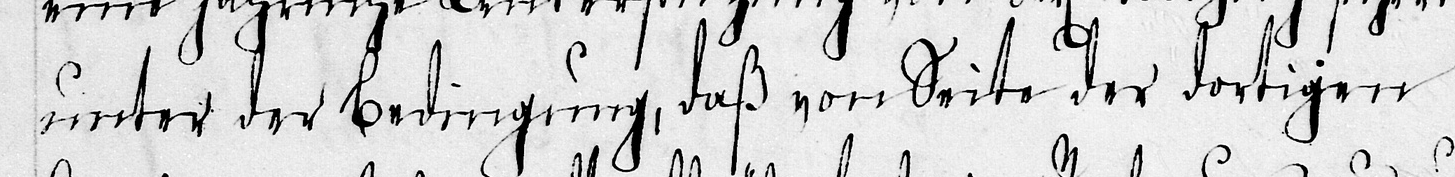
unter der Bedingung, daß von Seite der dortigen
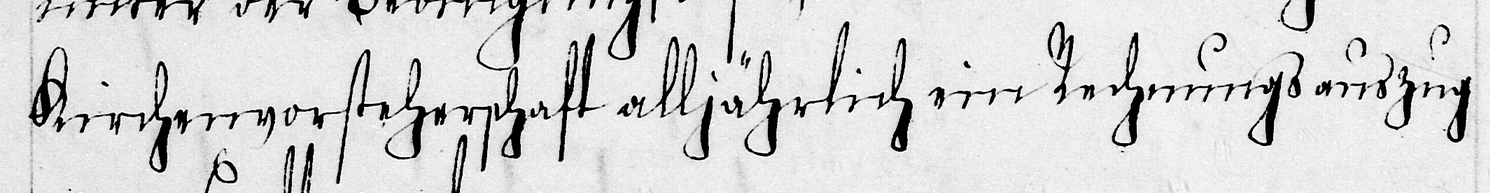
Kirchenvorsteherschaft alljährlich ein Rechnungsauszug
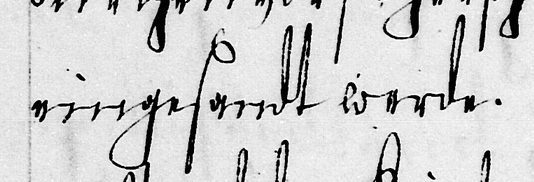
eingesandt werde.
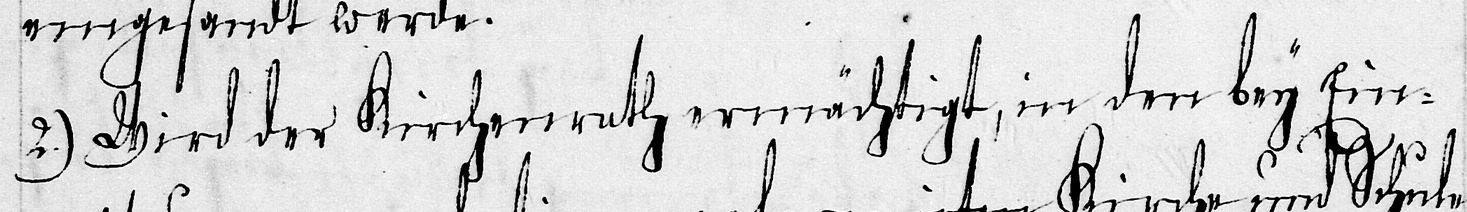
2.) Wird der Kriegsrath ermächtigt, in den bey Ein¬
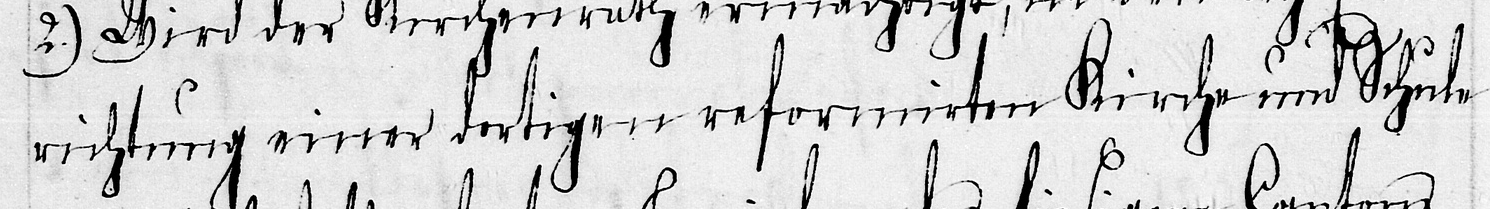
richtung einer dortigen reformirten Kirche und Schule
